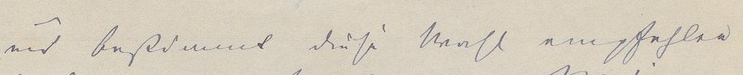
und bestimmt diese Wahl empfehlen.
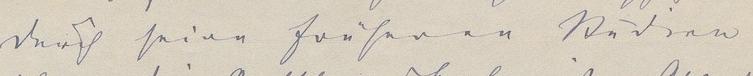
Durch seine früheren Studien
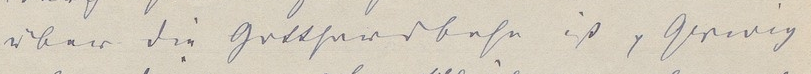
über die Gotthardbahn ist Gerwig
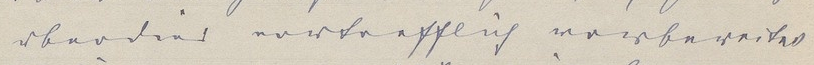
überdies vortrefflich vorbereitet
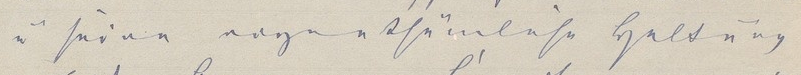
u seine eigenthümliche Haltung
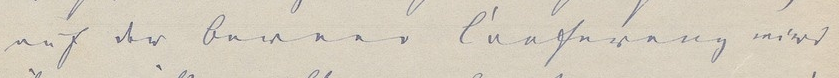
auf der Berner Conferenz wird
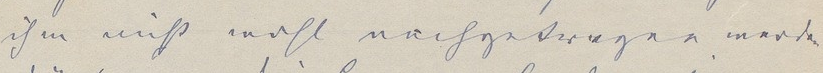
ihm nicht wohl nachgetragen werden
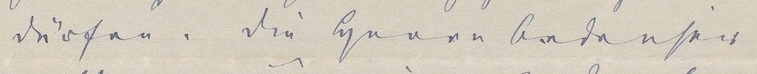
dürfen. Die Herrn Badenser
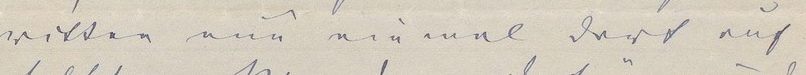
ritten nun einmal dort auf
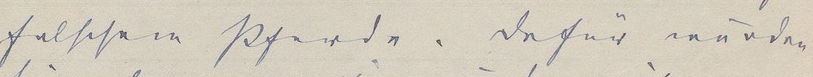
falschem Pferde. Dafür wurden
